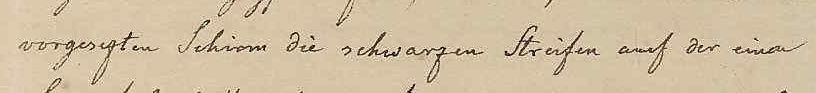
vorgesezten Schirm die schwarzen Streifen auf der einen
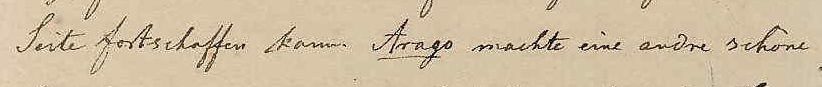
Seite fortschaffen kann. Arago machte eine andre schöne
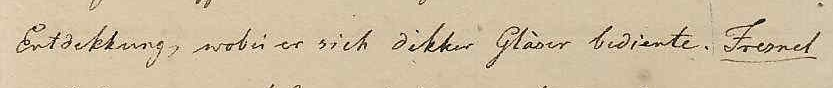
Entdekkung, wobei er sich dikker Gläser bediente. Fresnel
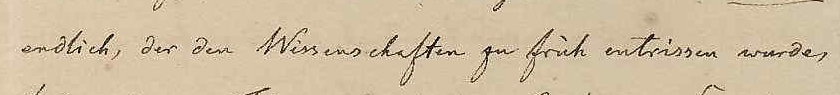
endlich, der den Wissenschaften zu früh entrissen wurde,
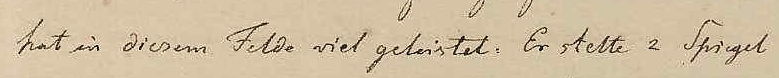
hat in diesem Felde viel geleistet. Er stelte 2 Spiegel
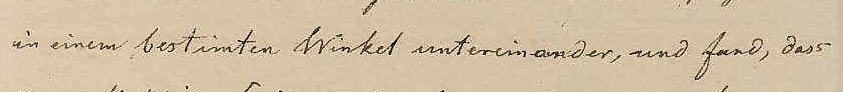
in einem bestimten Winkel untereinander, und fand, dass
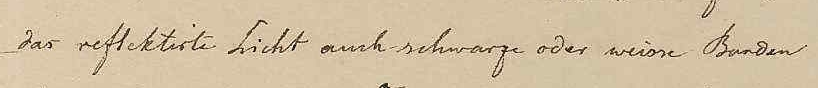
das reflektirte Licht auch schwarze oder weisse Banden
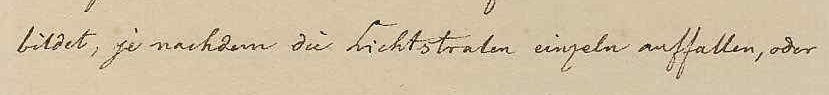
bildet, je nachdem die Lichtstralen einzeln auffallen, oder
